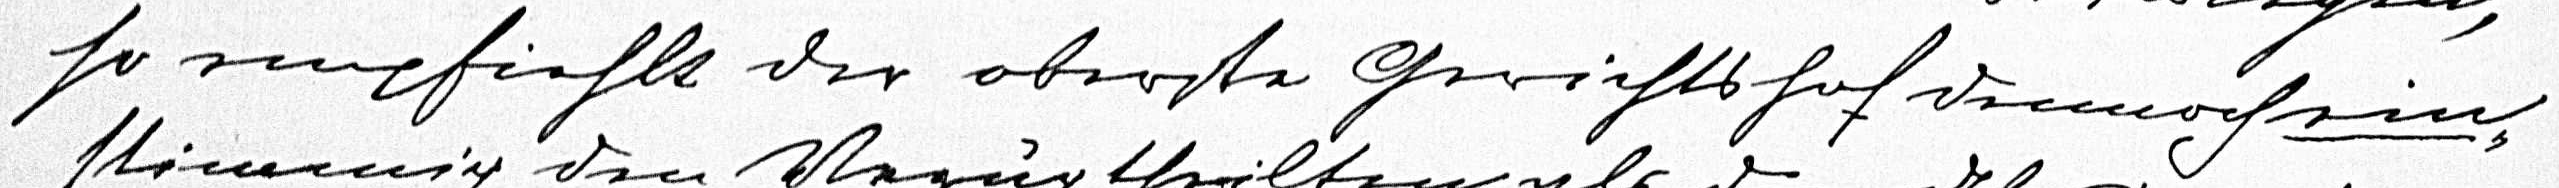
so empfiehlt der oberste Gerichtshof dennoch ein¬
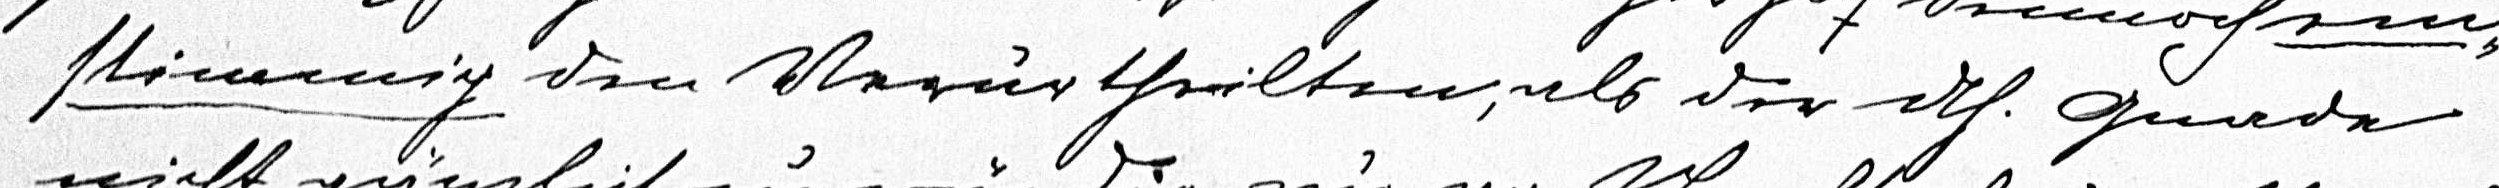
stimmig den Verurtheilten, als der Ah. Gnade
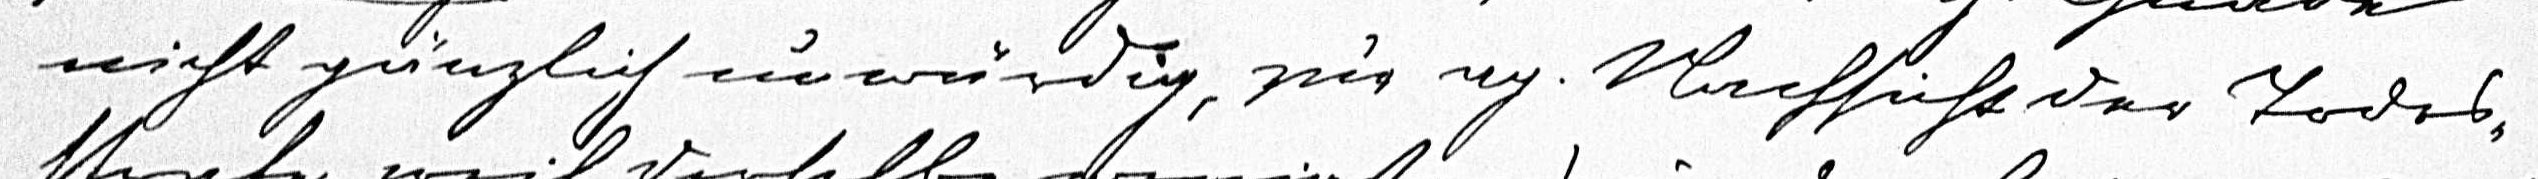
nicht gänzlich unwürdig, zur ag. Nachischt der Todes¬
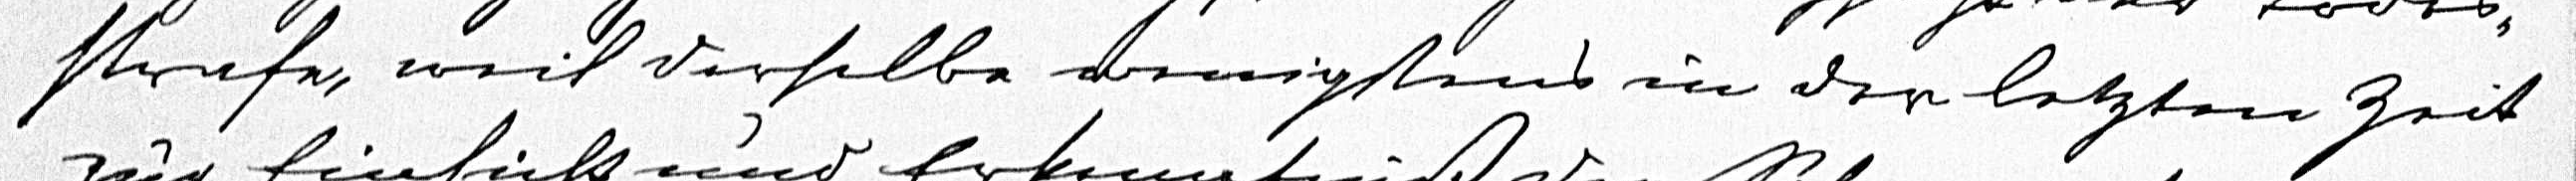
strafe, weil derselbe wenigstens in der letzten Zeit
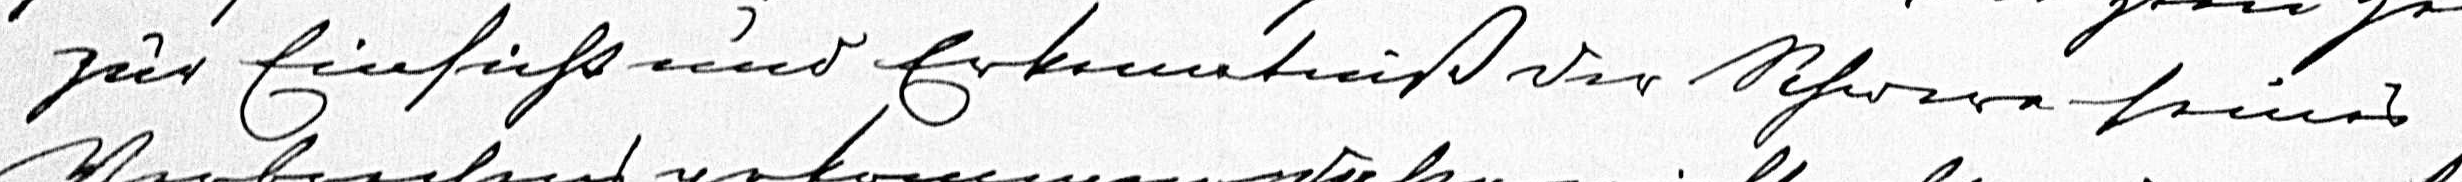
zur Einsicht und Erkenntniß der Schwere seines
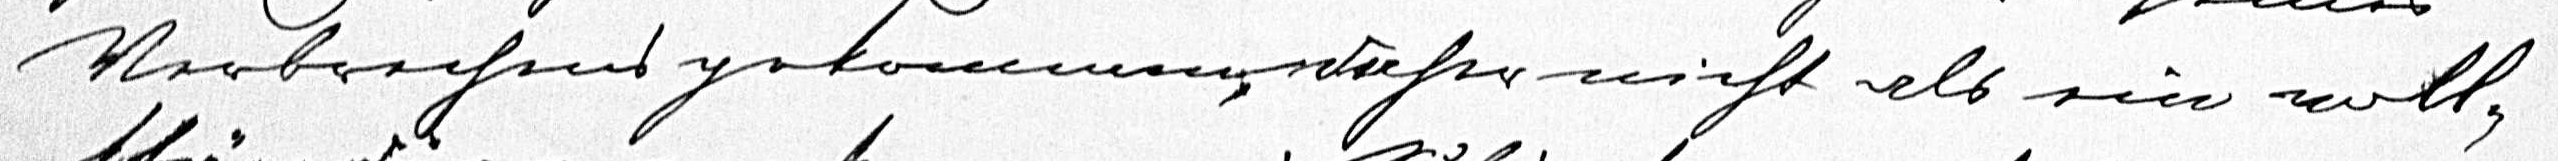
Verbrechens gekommen, daher nicht als ein voll¬
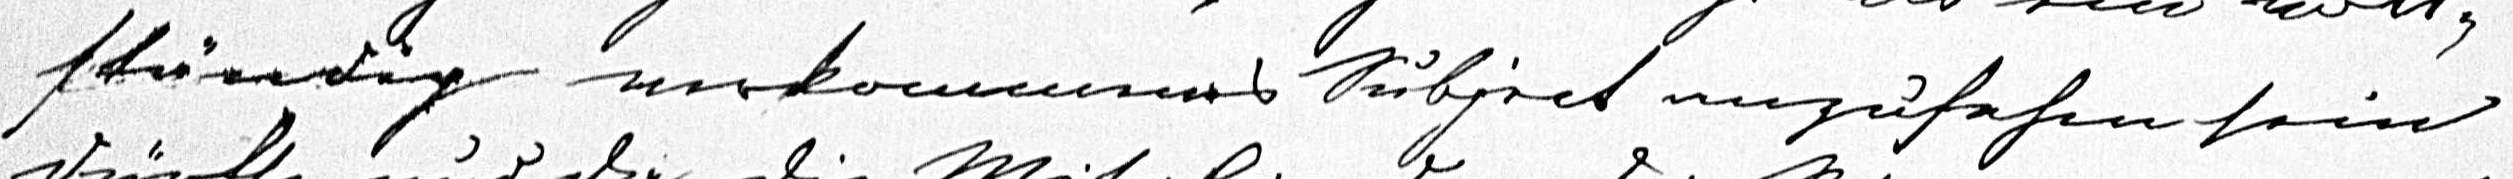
ständig verkommenes Subject anzusehen sein
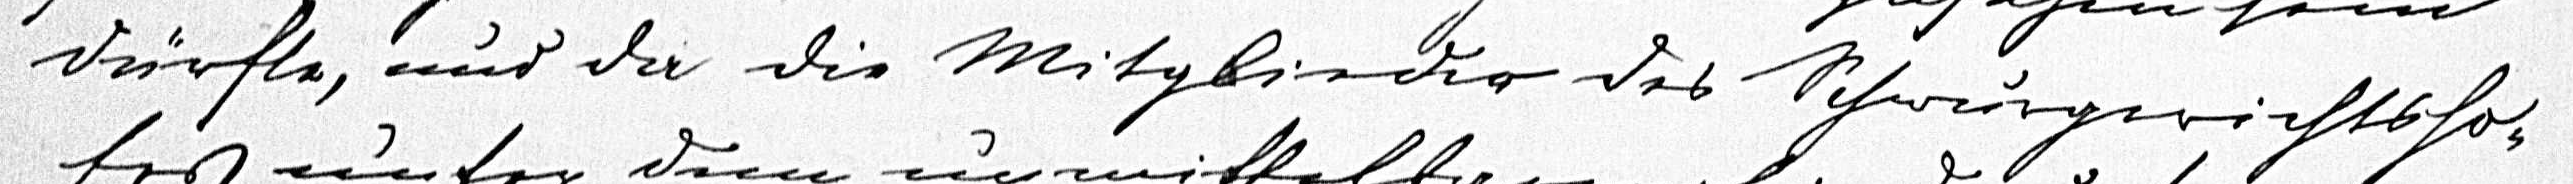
dürfte, und da die Mitglieder des Schurgerichtsho¬
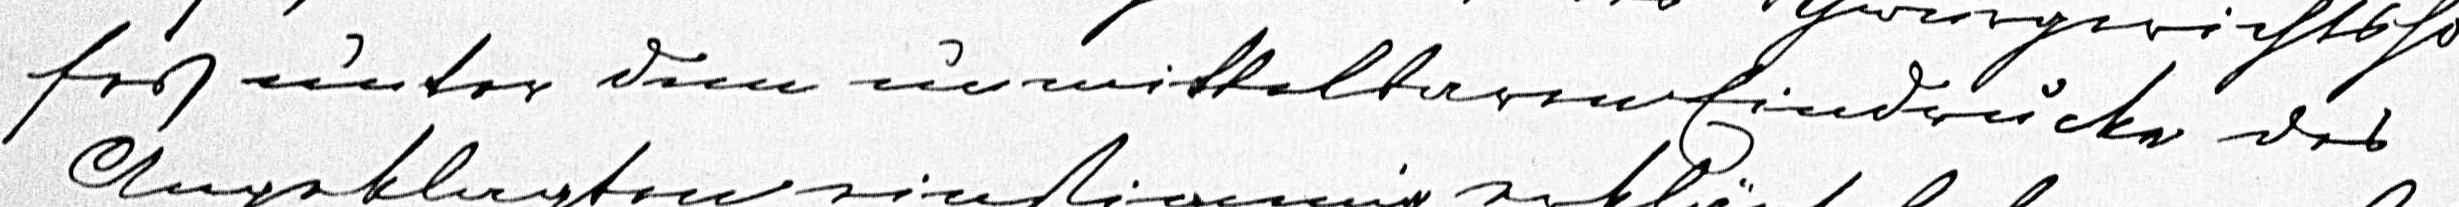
fes unter dem unmittelbaren Eindrucke des
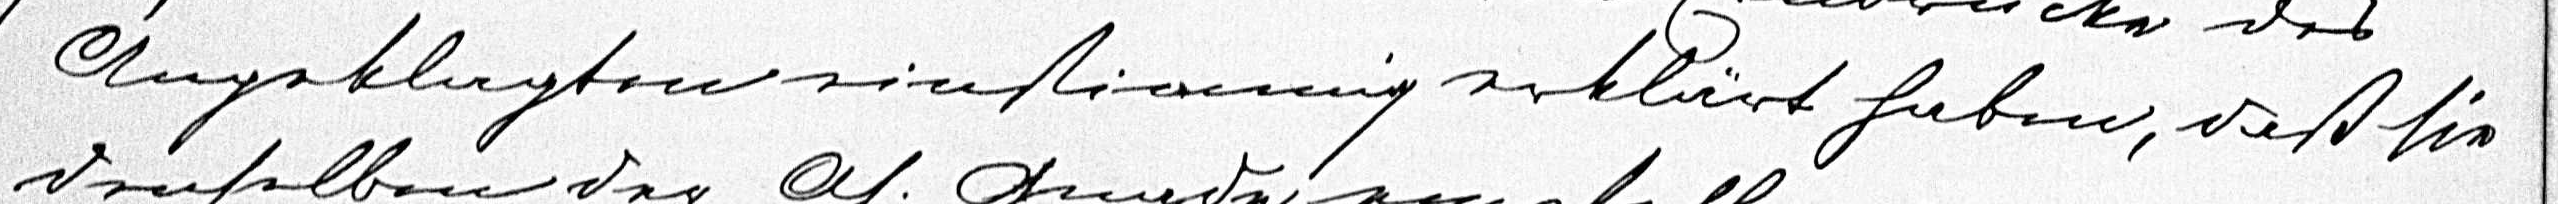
Angeklagten einstimmig erklärt haben, daß sie
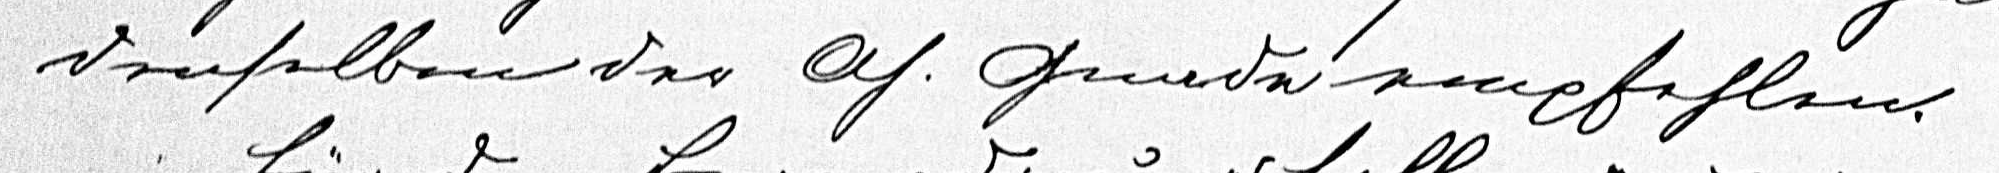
denselben der Ah. Gnade empfehlen.
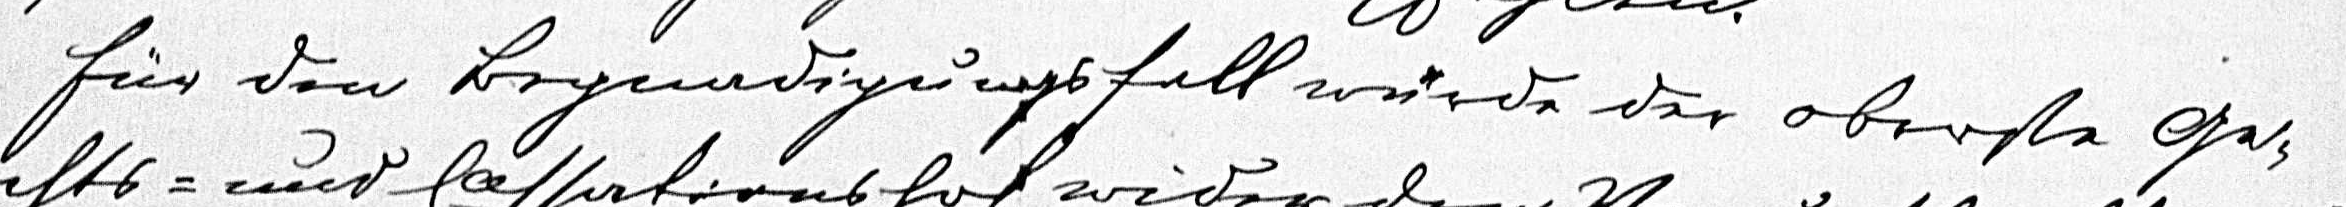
Für den Begnadigungsfall würde der oberste Ge¬
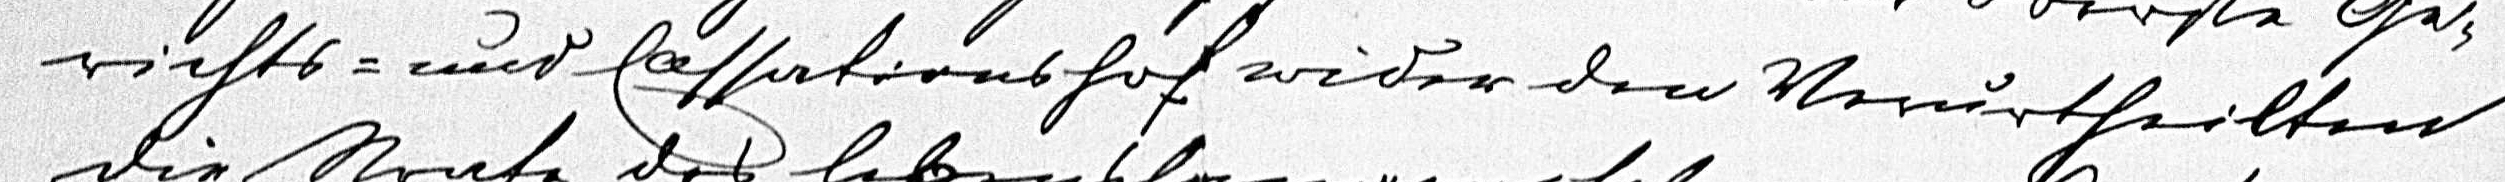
richts- und Cassationshof wider den Verurtheilten
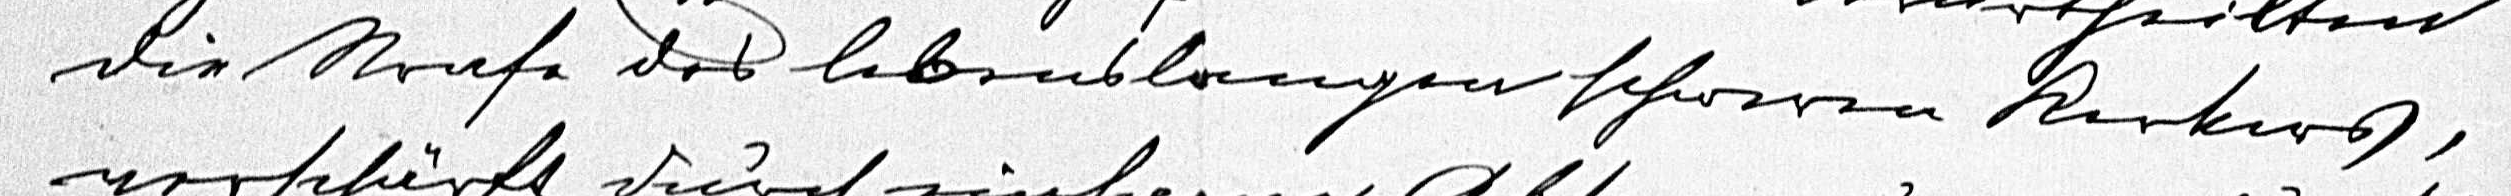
die Strafe des lebenslangen schweren Kerkers,
